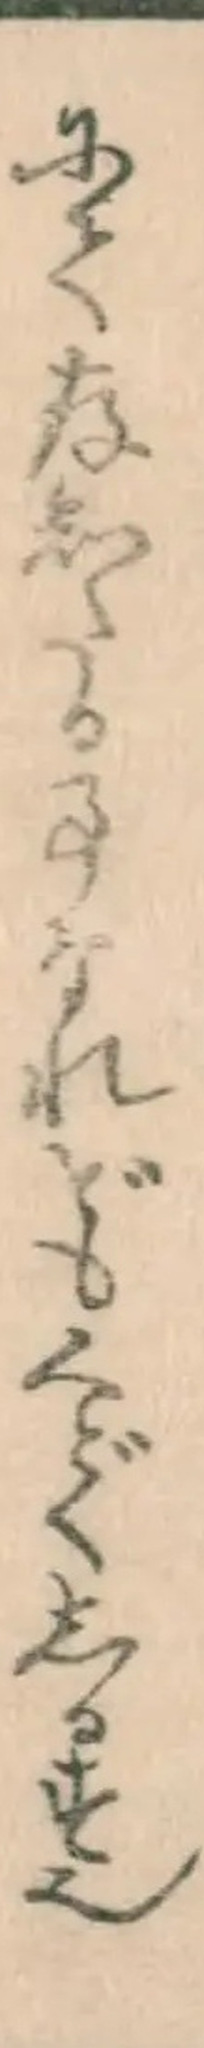にて存知たる事なれどもくどくしるす也
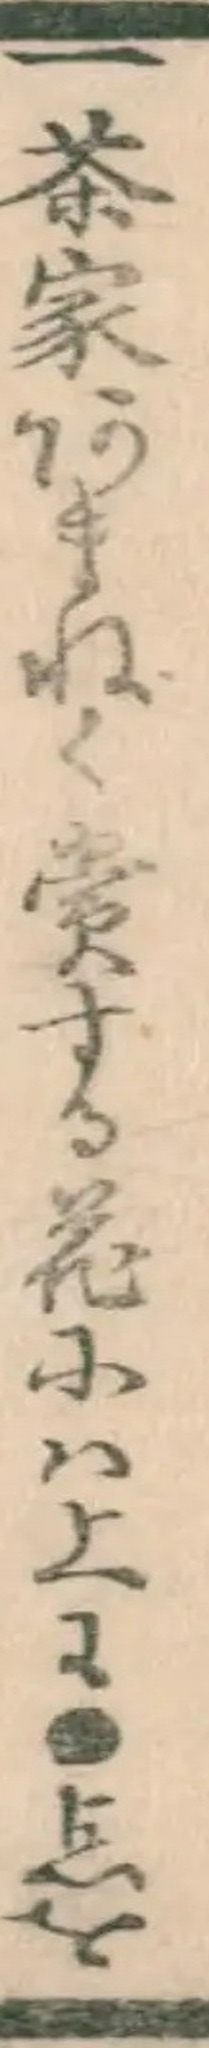一茶家あまねく賞する花に上に●点を
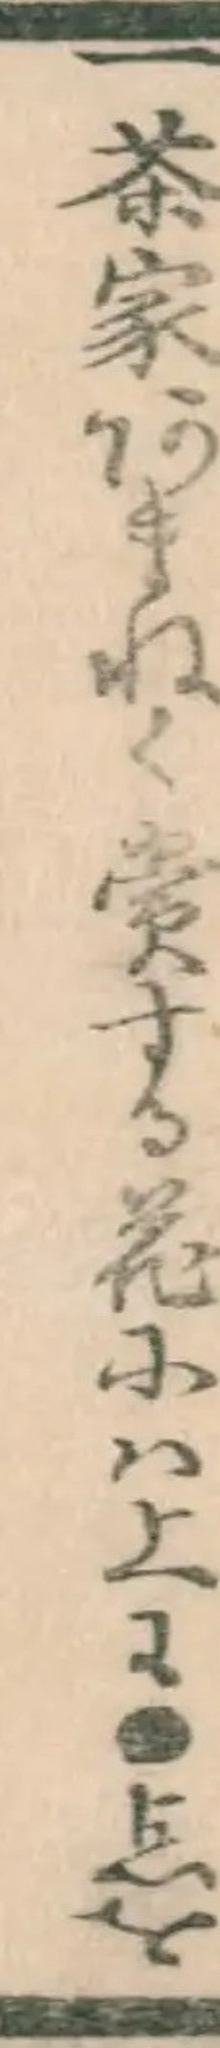一茶家あまねく賞する花に上に●点を
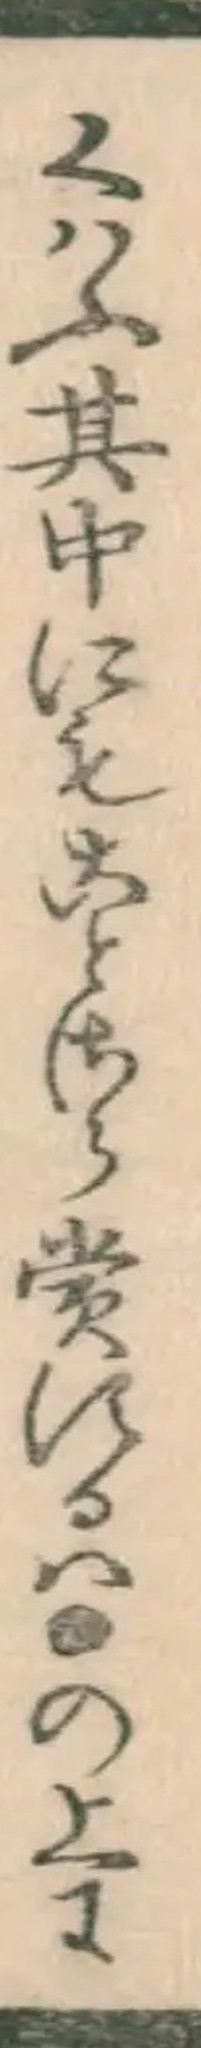くはふ其中にもことさら賞するは●の上に
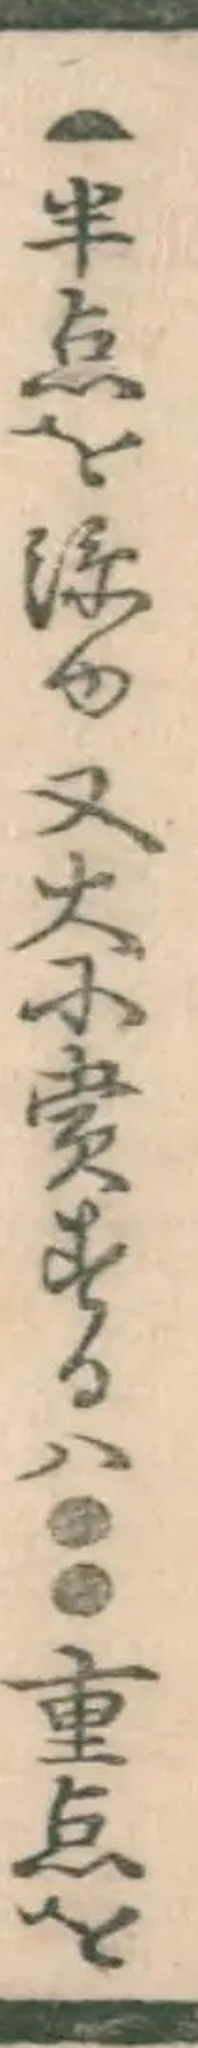▲半点を添ゆ又大に賞すつは●●重点を
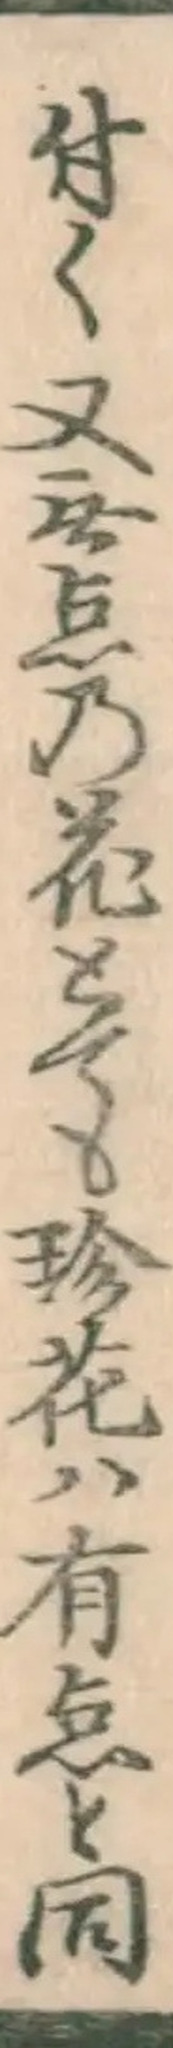付く又無点の花とても珍花は有点を同
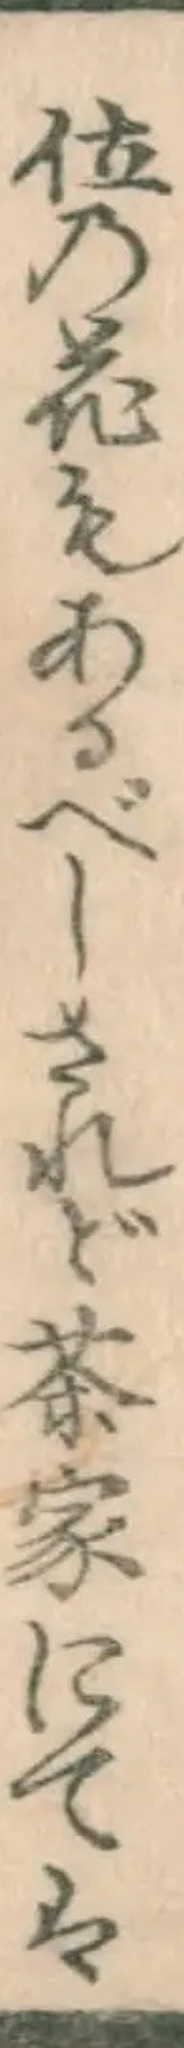位の花もあるべしされど茶家にては
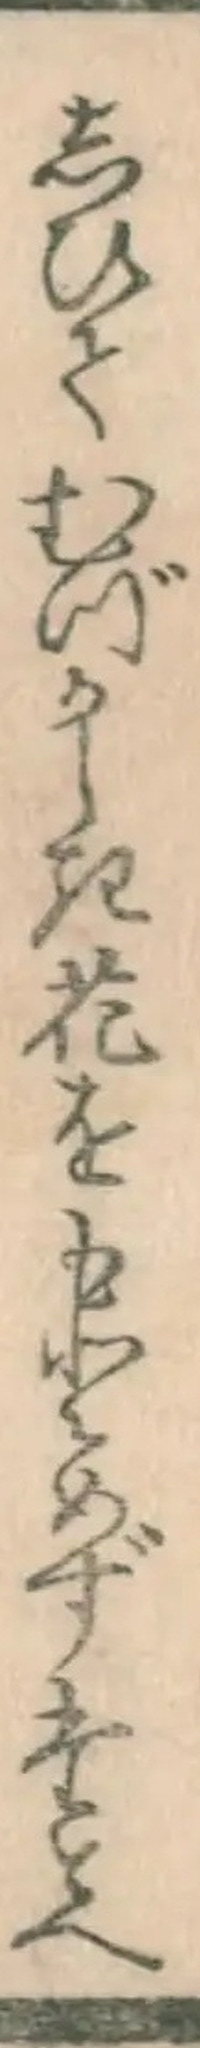しひてむづかしき花をもとめずたとへ
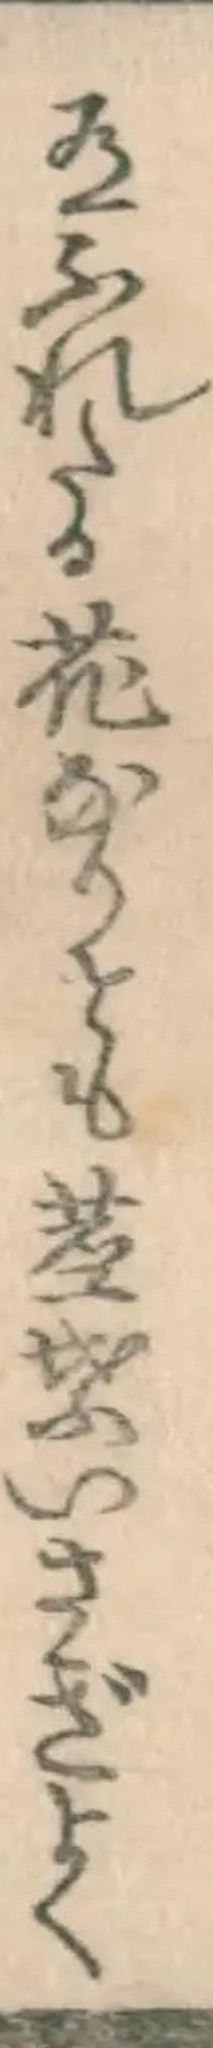有ふれたる花なりとも茎葉いさぎよく
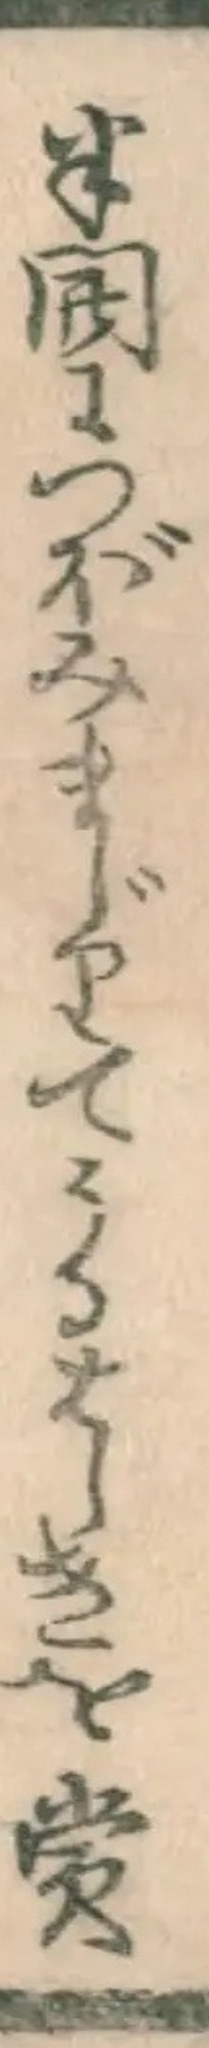半開につぼみまじりてうるはしきを賞
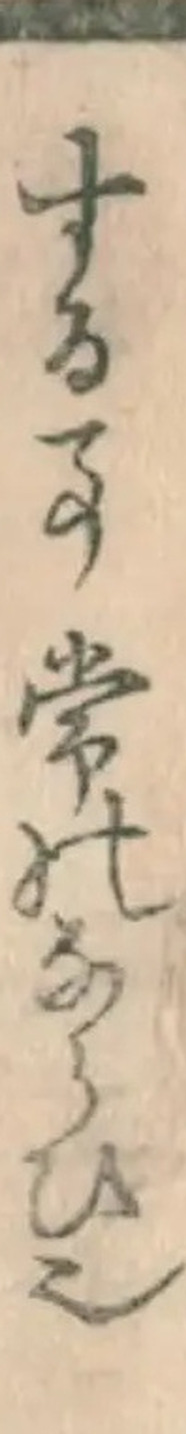する事常のならひ也
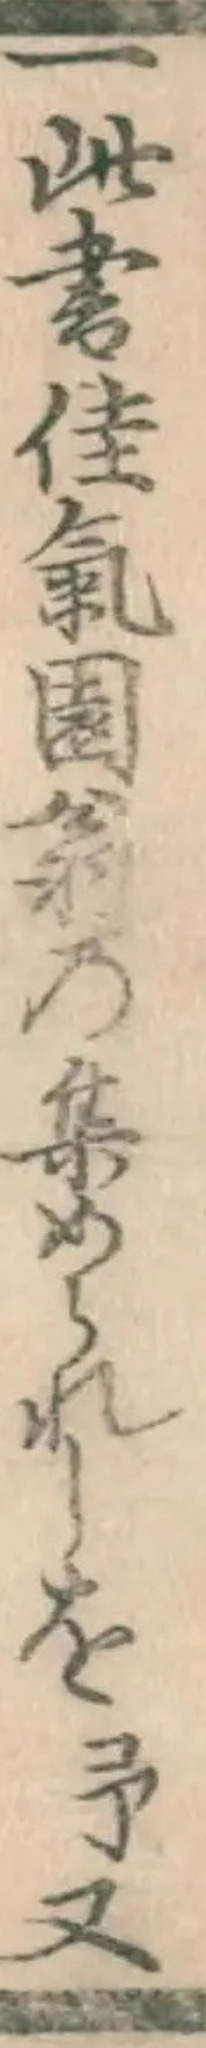一此書佳気園翁の集められしを予又
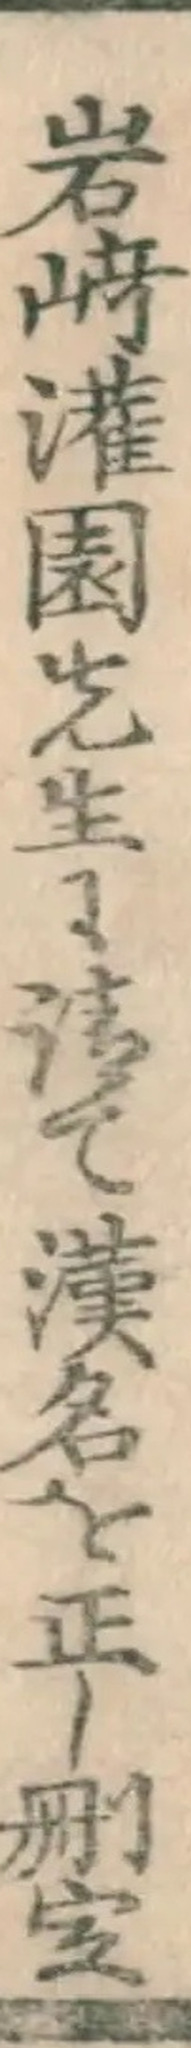岩崎潅園先生に請て漢名を正し刪定
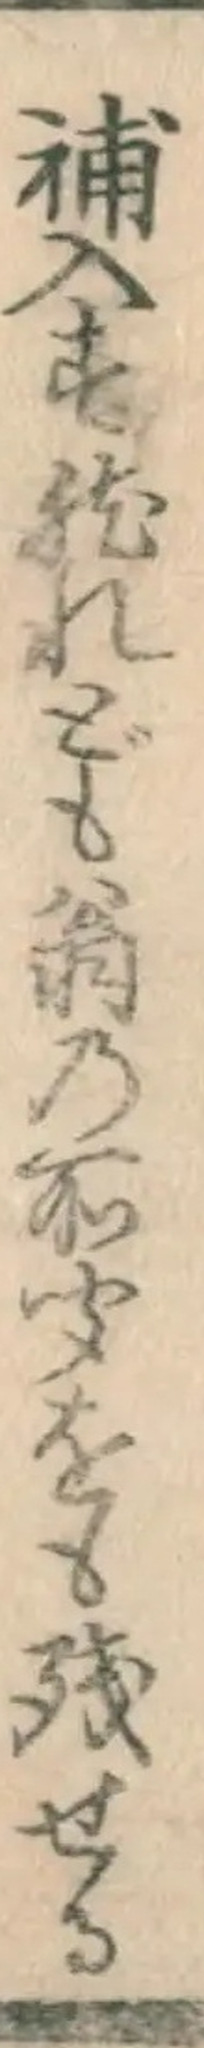補入す然れども翁の前聞をも残せる
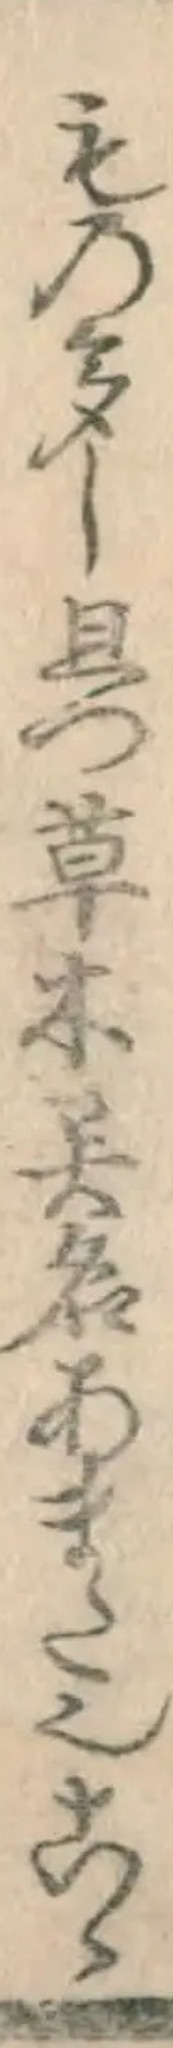もの多し且つ草木異名あまた也こゝ
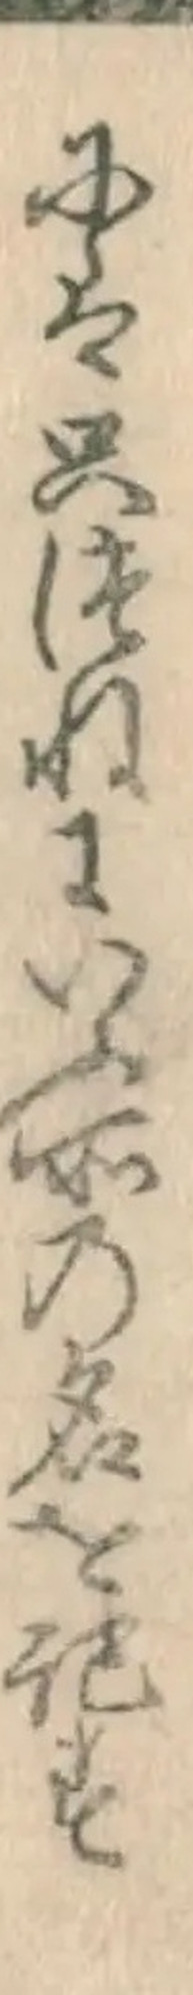には只つねにいふ所の名を記す
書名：茶席挿花集
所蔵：国立国会図書館 National Diet Library, JAPAN
